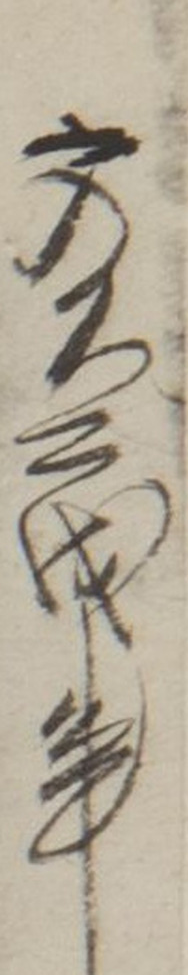文久二戌年
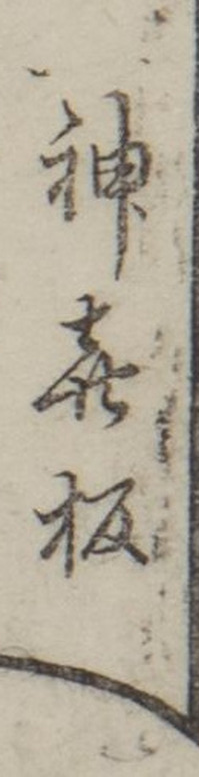神喜板
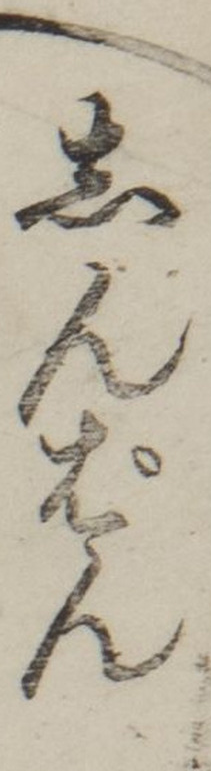しんぱん
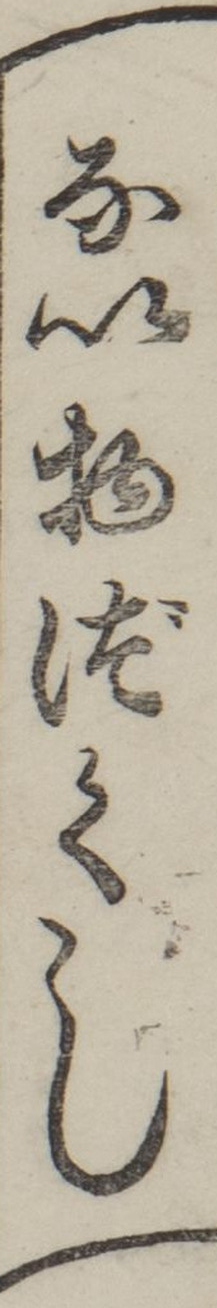ない物づくし
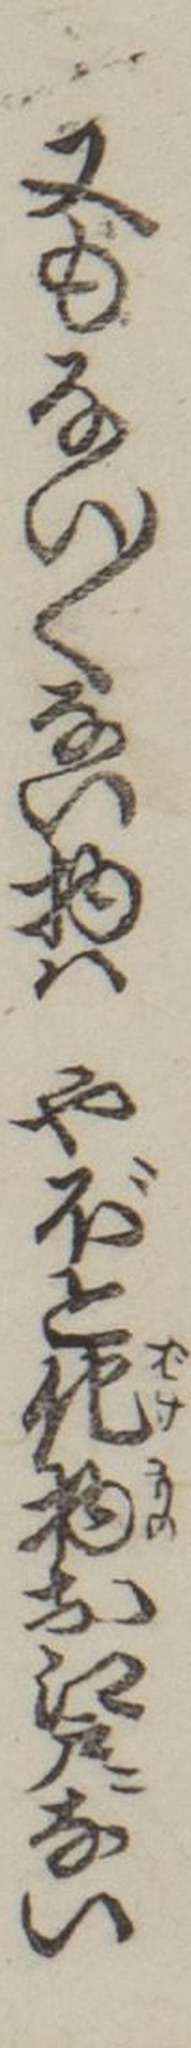又もない〳〵ない物はやぼと化物お江戸にない
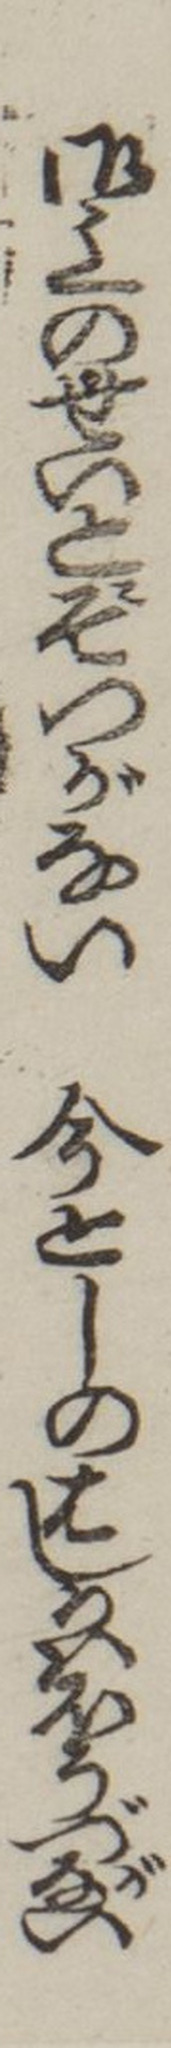御上のせいとにそつがない今としのはしかはほうづがない
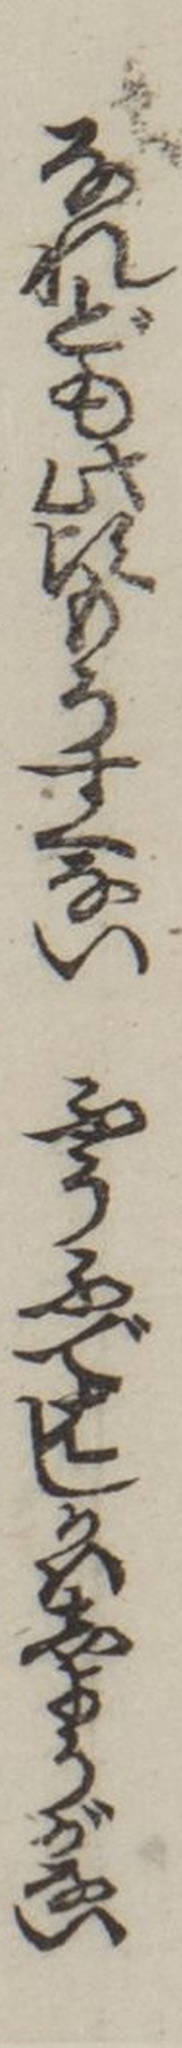なれども此頃もうすへないふうふではしかはしようがない
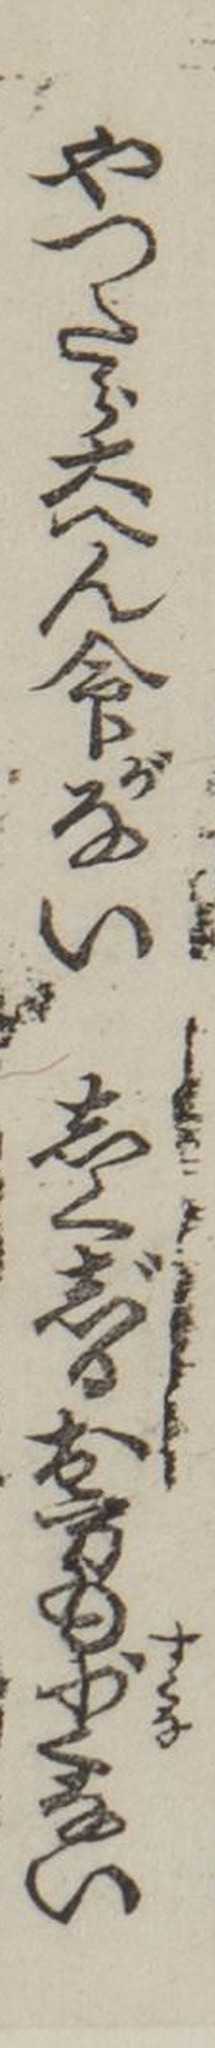やつたら大へん命がないしくじるお方も少くない
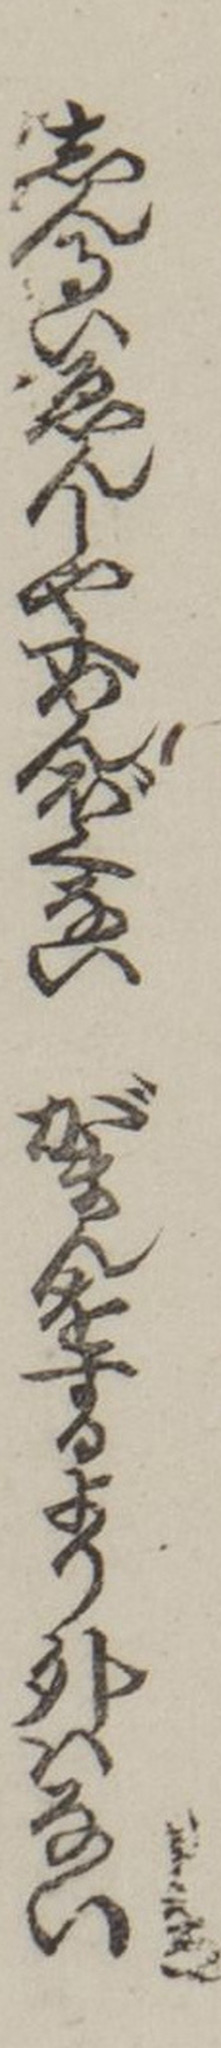しんるいゑんしやへめんぼくないがまんをするより外はない
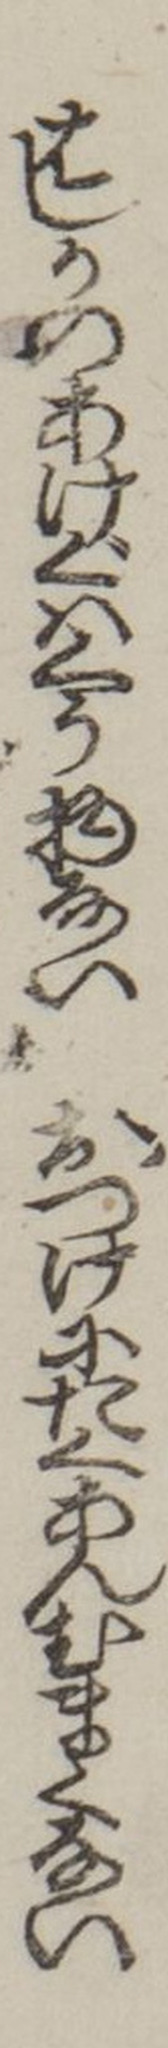はしかのあけぐはくう物ないおつけにたくわんむまくない
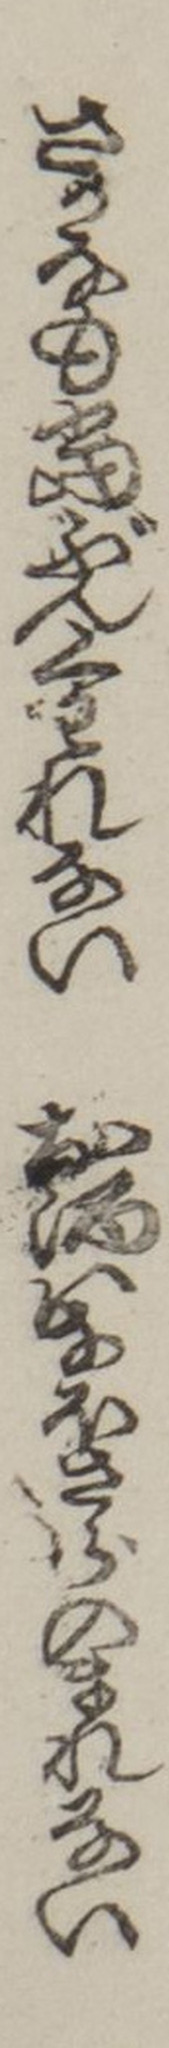さかなも当ぶんくわれないお酒はなほさらのまれない
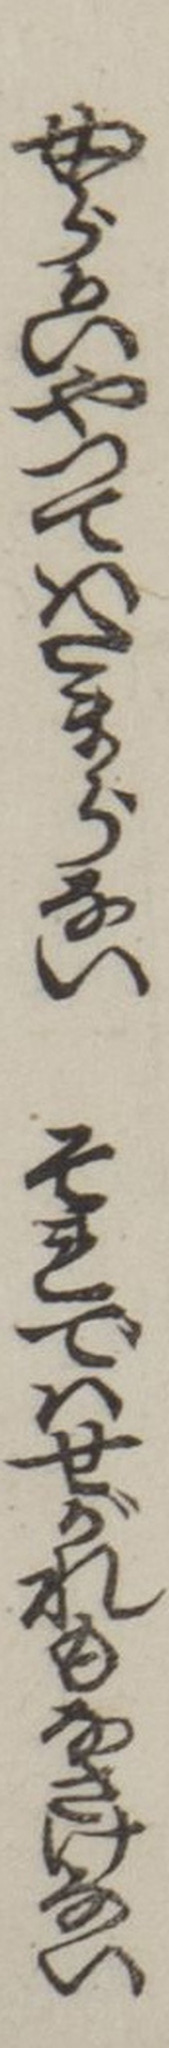やらかいやつてはたまらないそれではせがれもなさけない
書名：しんぱんない物づくし
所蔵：あいおいニッセイ同和損保株式会社
